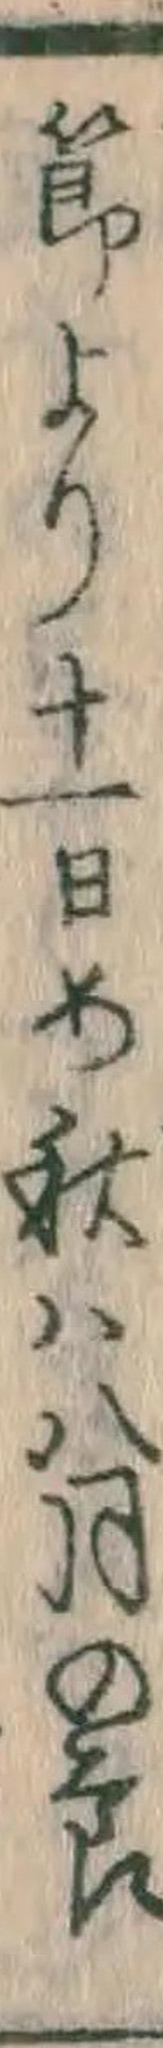節より十一日め秋は八月の節
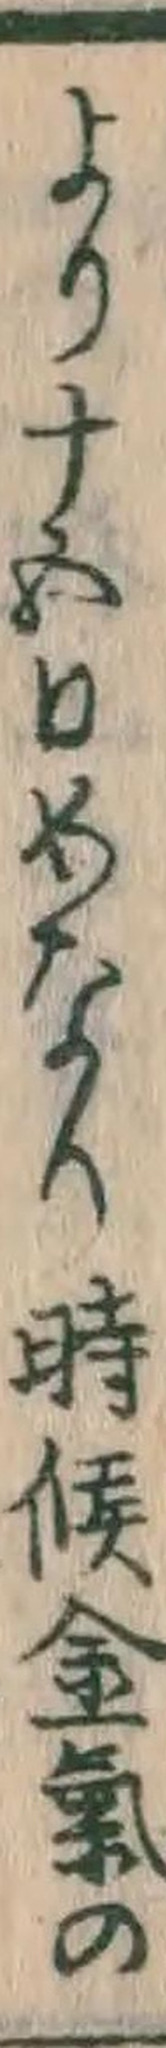より十五日めなり時候金気の
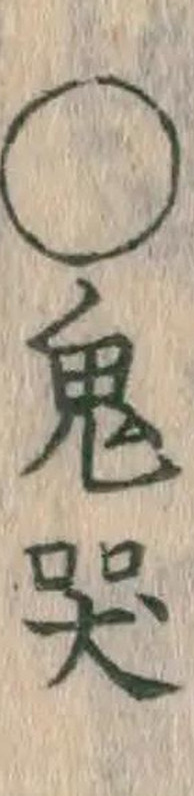○鬼哭
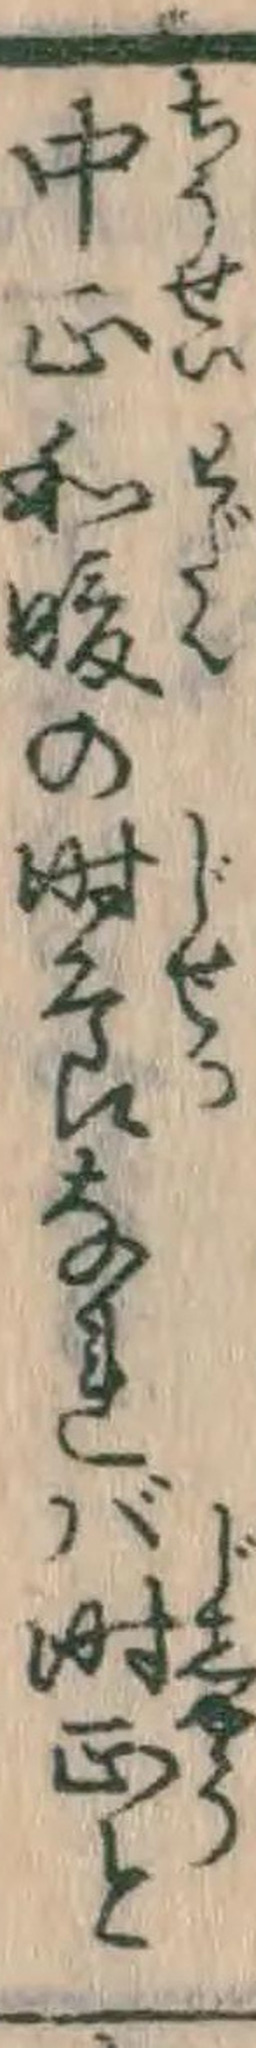中正和暖の時節なれば時正と
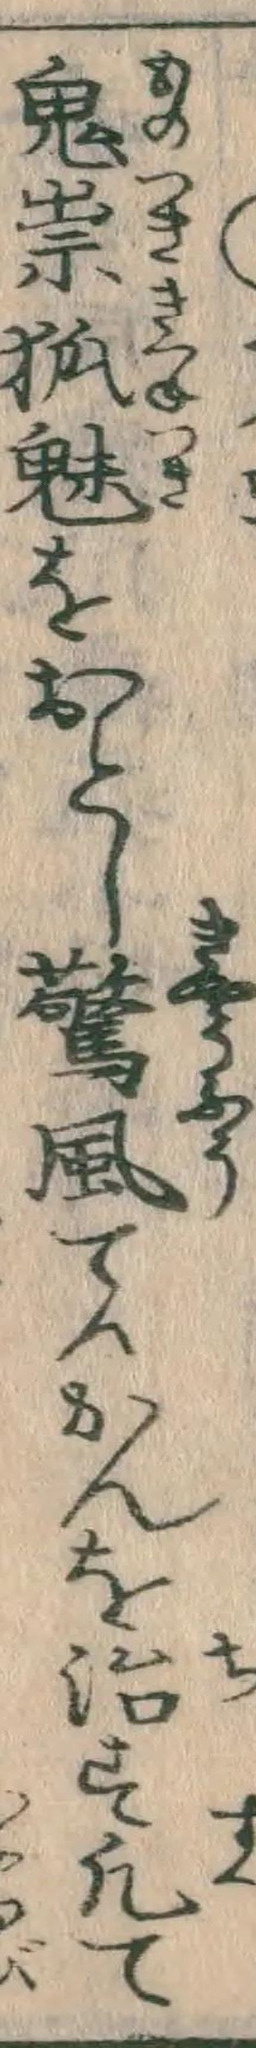鬼祟狐魅をおとし驚風てんかんを治す凡て
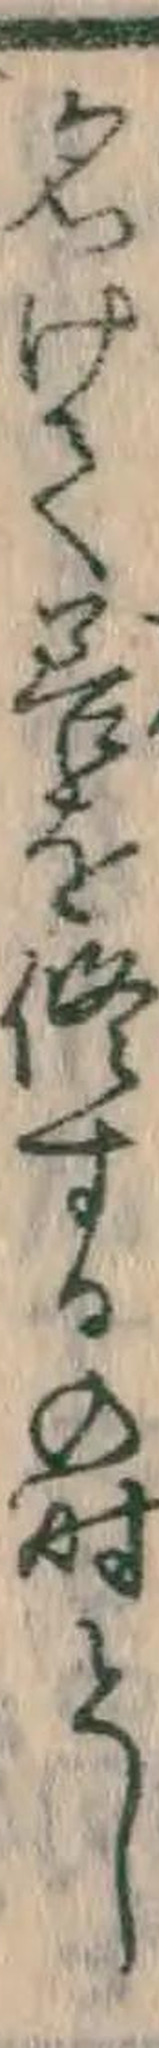名けて善を修するの時とし
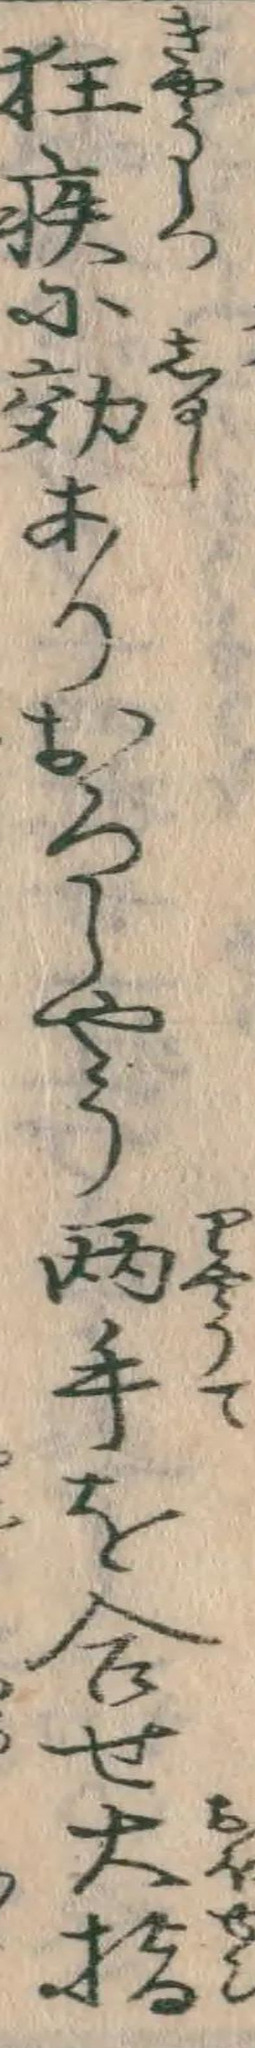狂疾に効ありおろしやう両手を合せ大指
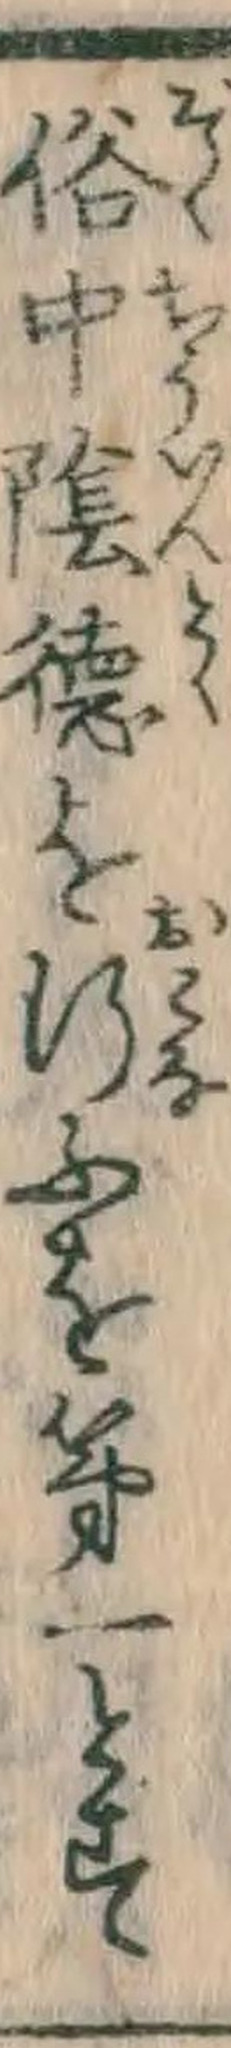俗中陰徳を行ふを第一とす
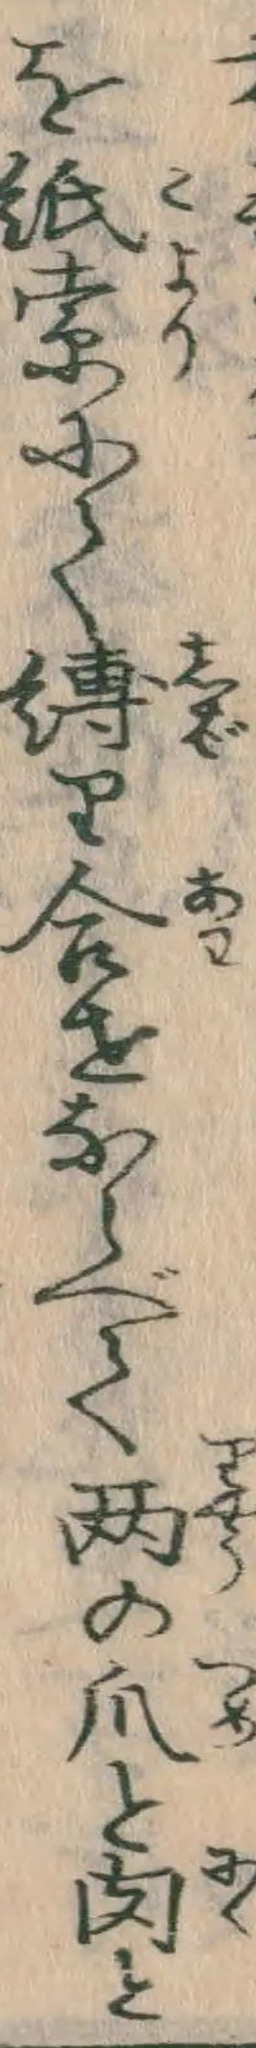を紙索にて縛り合せならべて両の爪と肉と
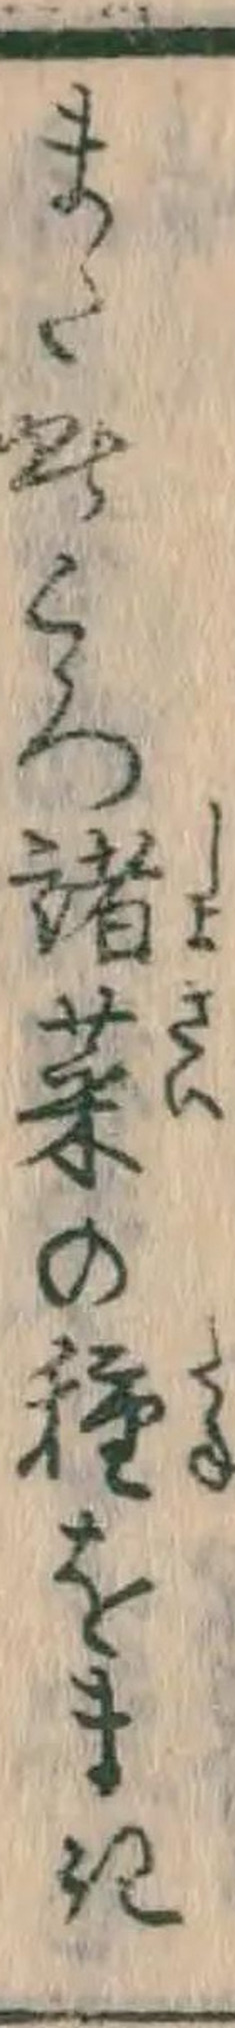また此ころ諸菜の種をまき
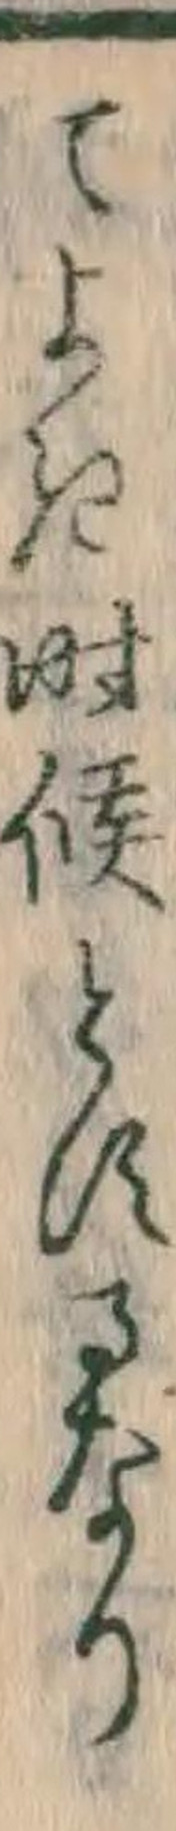てよき時候とするなり
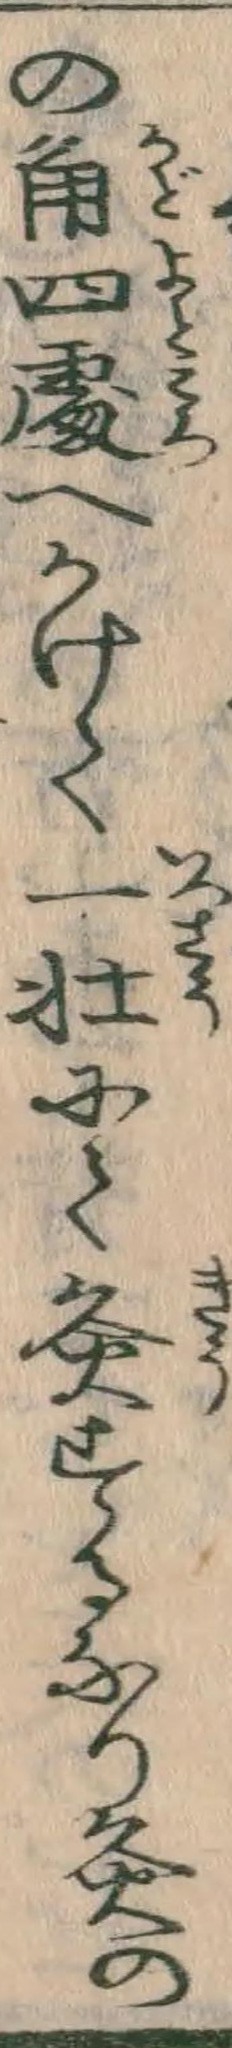の角四処へかけて一壮にて灸するなり灸の
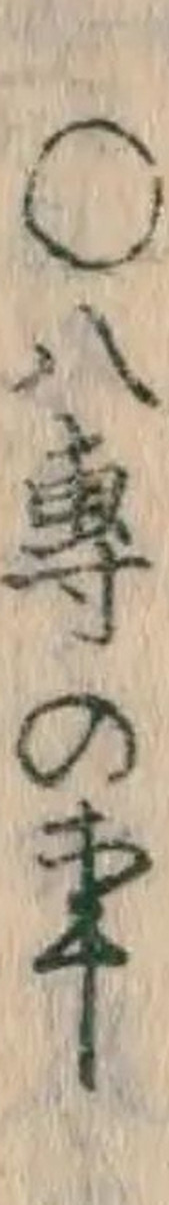○八専の事
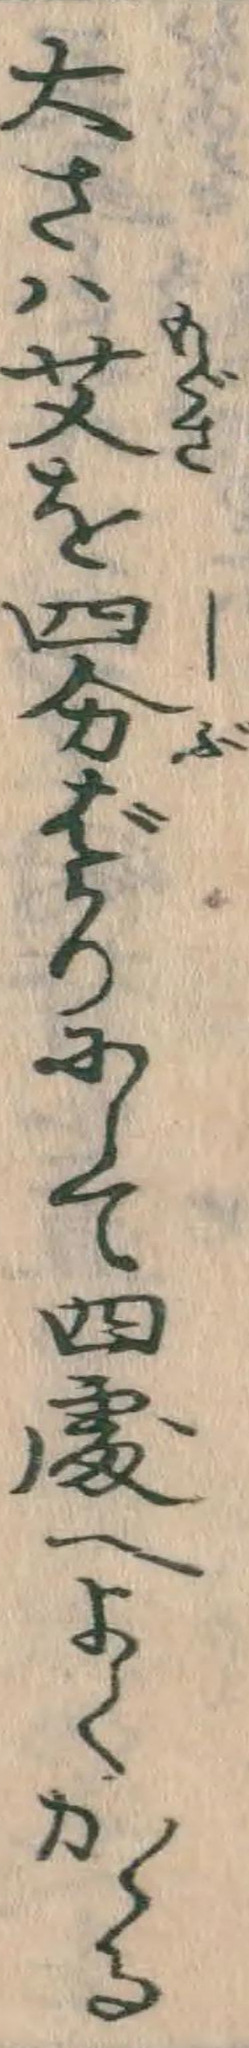大さは艾を四分ばかりにして四処へよくかゝる
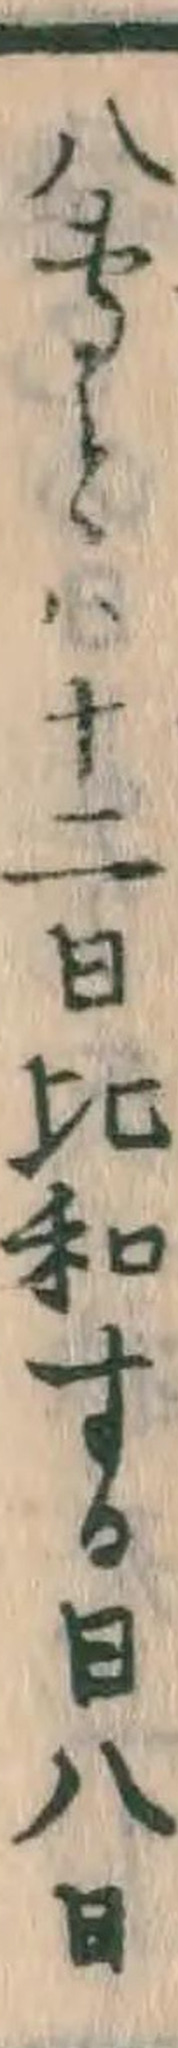八専とは十二日比和する日八日
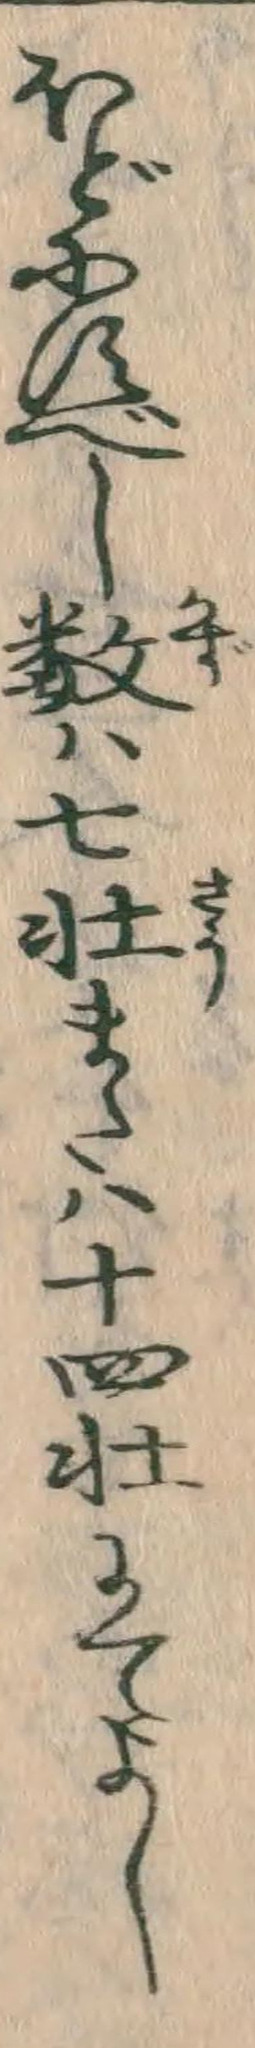ほどにすべし数は七壮または十四壮にてよし
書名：広益秘事大全 3巻. [4]
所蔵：国立国会図書館 National Diet Library, JAPAN
